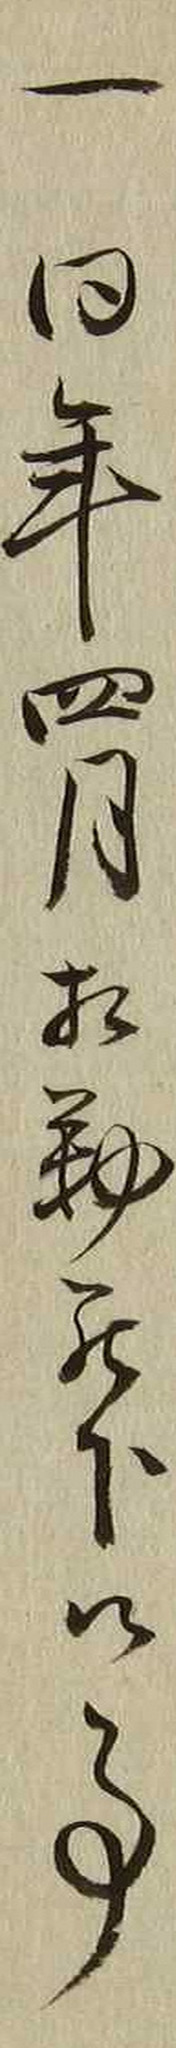一同年四月相勤罷下候事
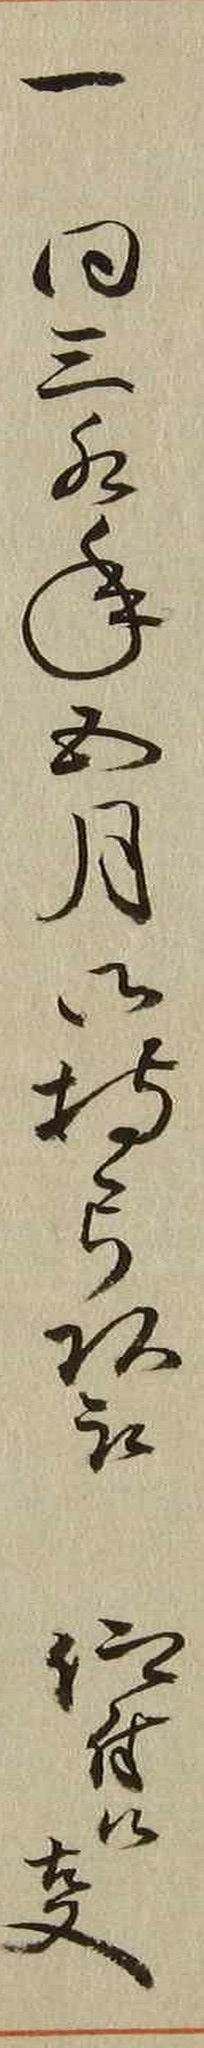一同三卯年五月持弓頭被仰付候事
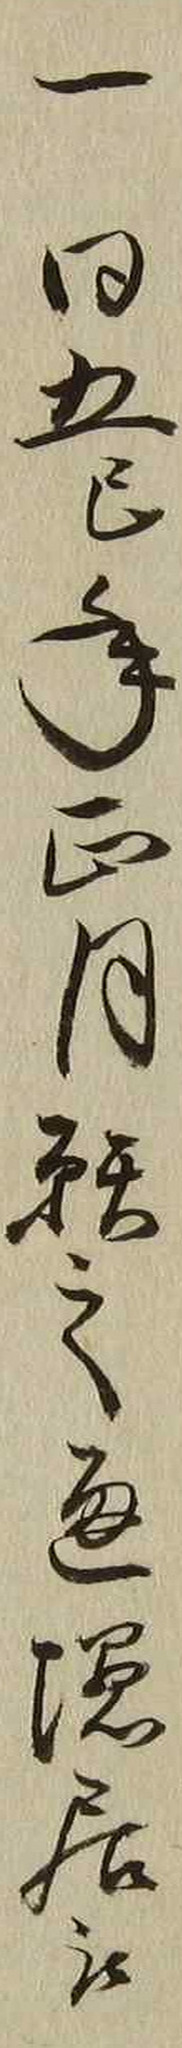一同五巳年正月願之通隠居被
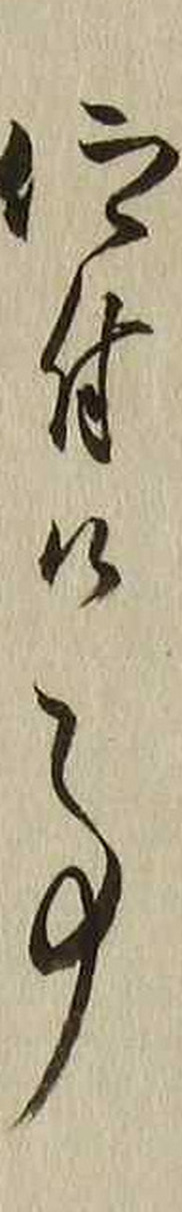仰付候事
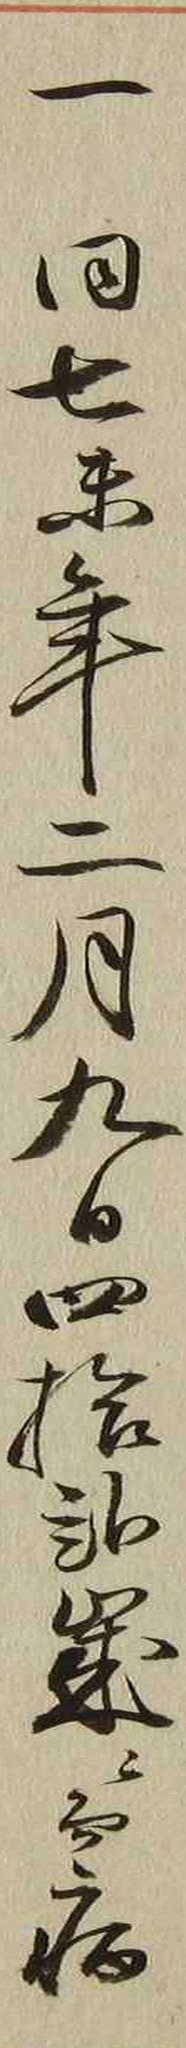一同七未年二月九日四拾弐歳ニ而病
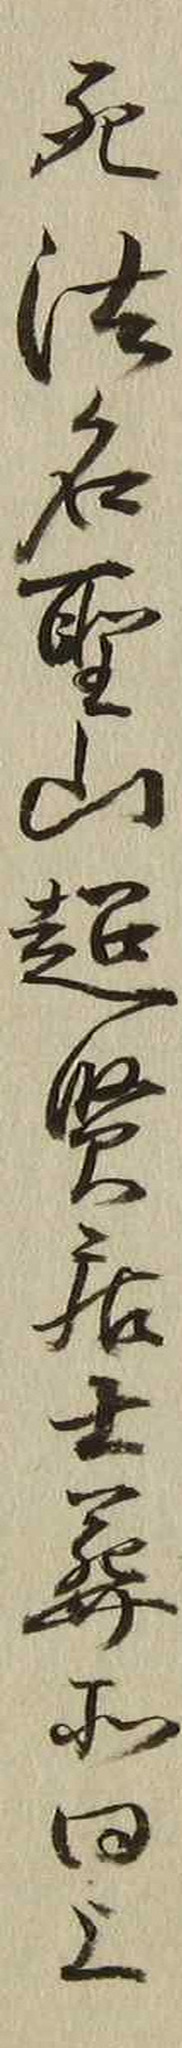死法名聖山超賢居士葬所同上
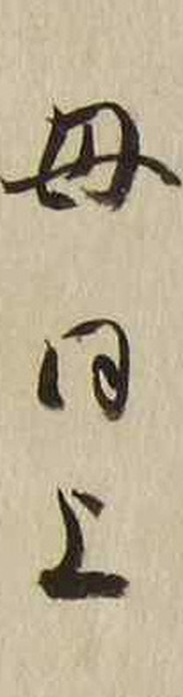母同上

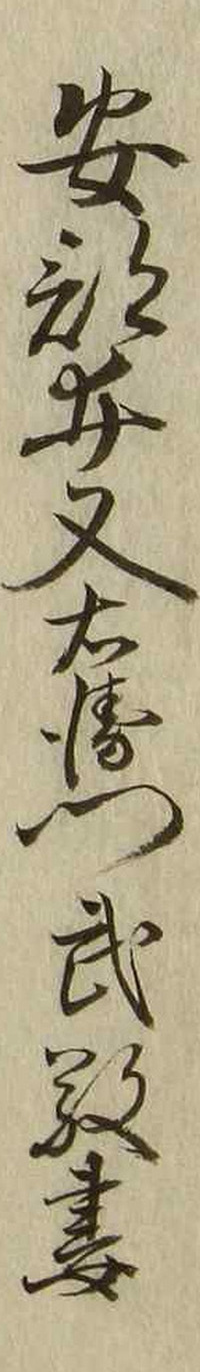女阿部井又右衛門武敬妻
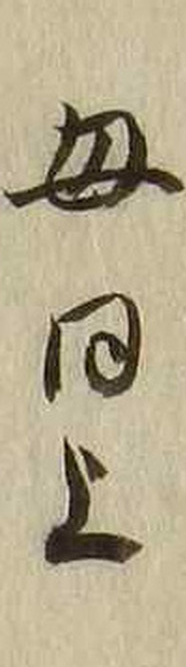母同上
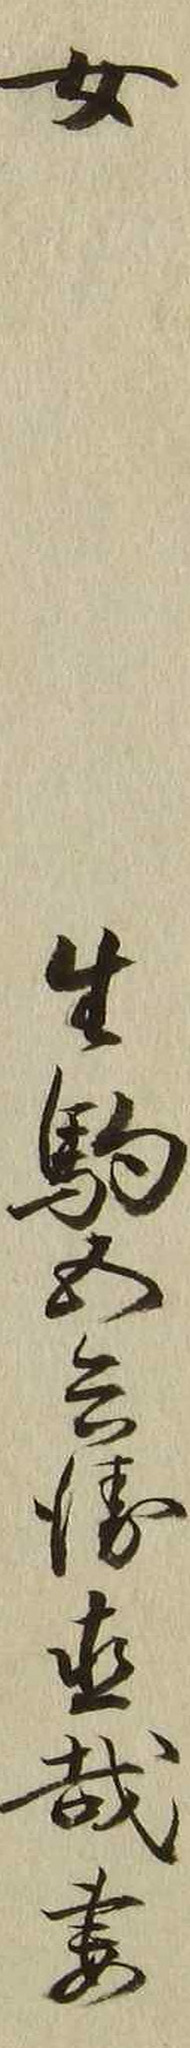女生駒五兵衛直哉妻
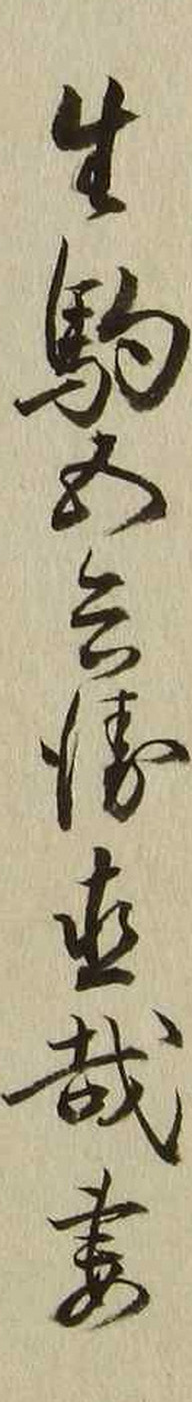女生駒五兵衛直哉妻
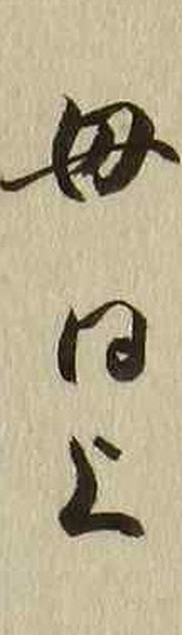母同上
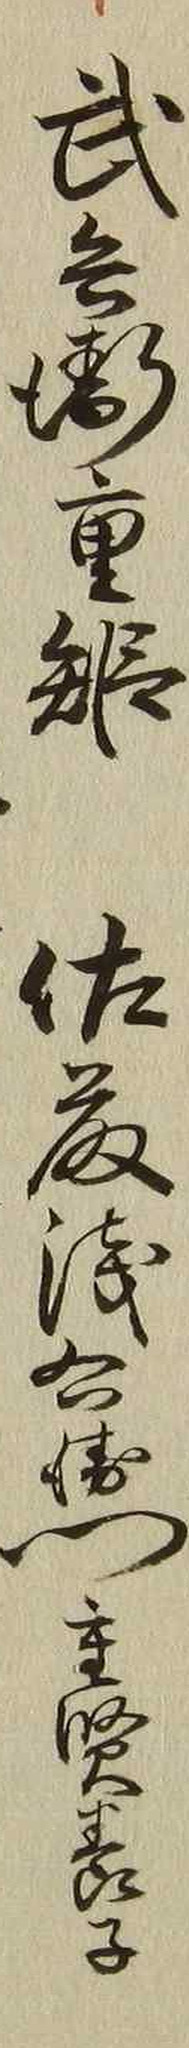武兵衛重矩佐藤浅右衛門重賢養子
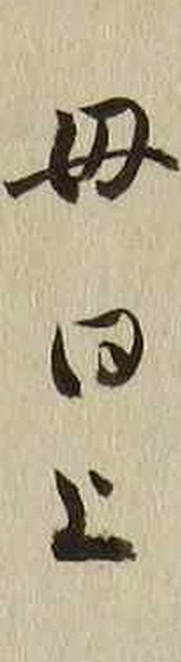母同上
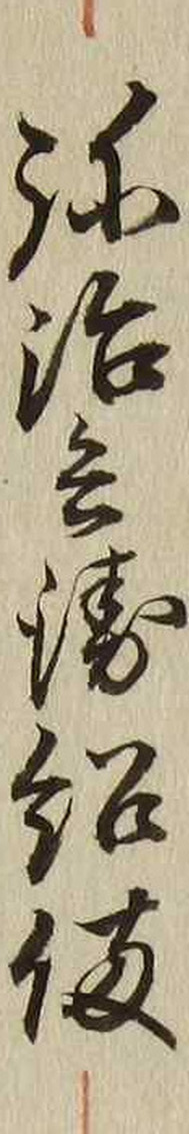弥治兵衛紹備
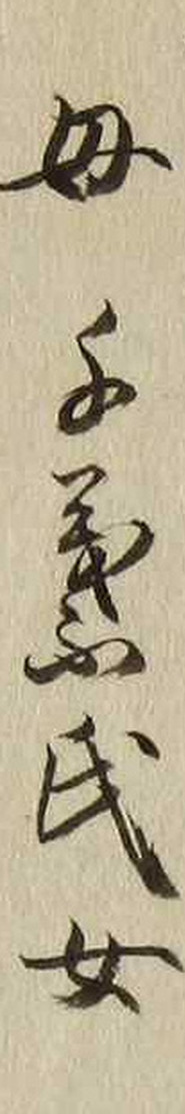母千葉氏女
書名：諸士系譜　巻之60　と之部3
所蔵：会津若松市立会津図書館
